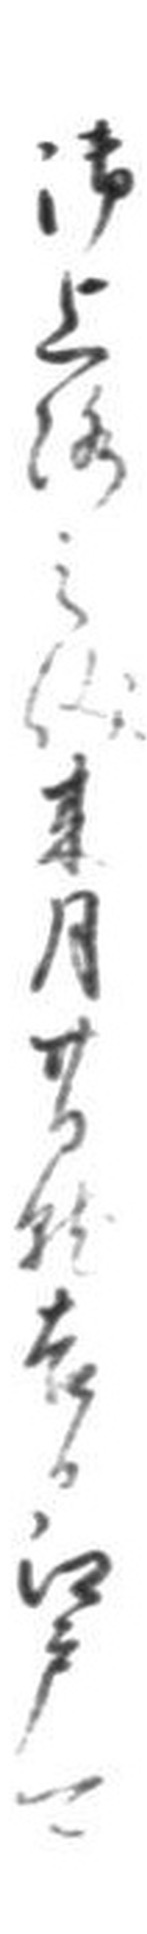御上洛之儀来月廿日就吉日江戸可
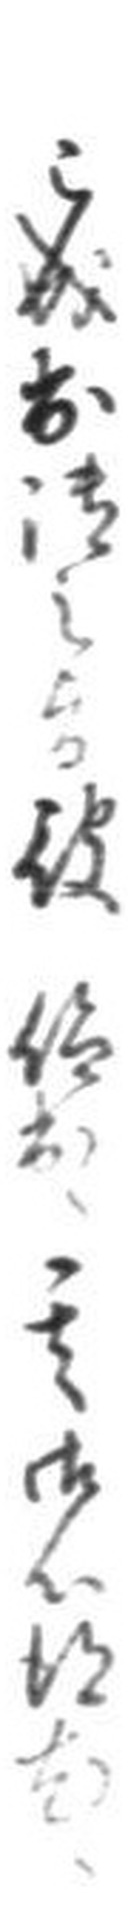被成出御之旨被仰出候其御心得尤候
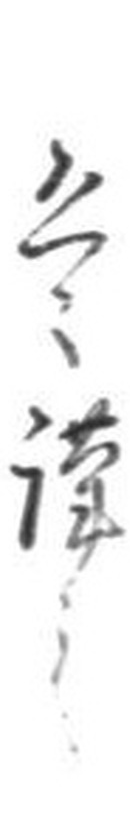恐々謹言
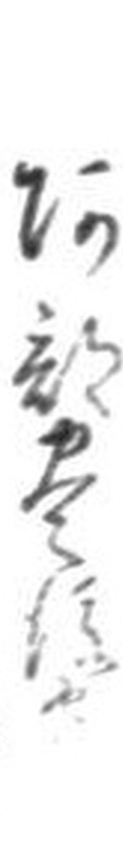阿部豊後守
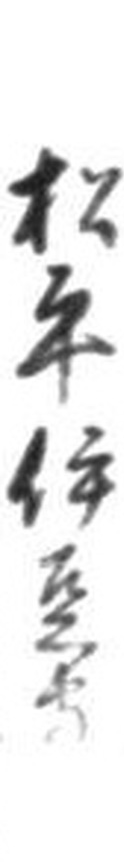松平伊豆守
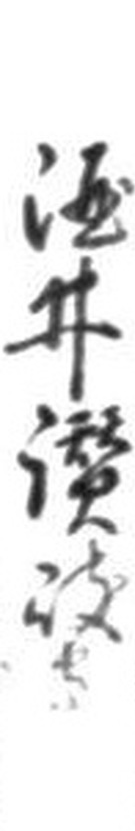酒井讃岐守

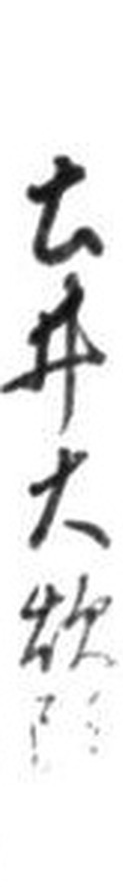土井大炊頭
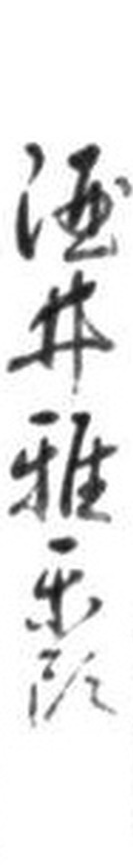酒井雅楽頭
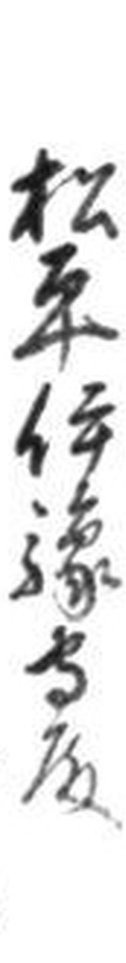松平伊予守殿
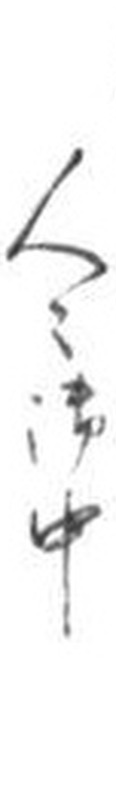人々御中
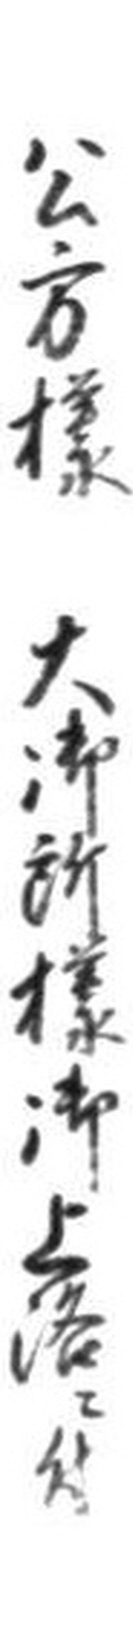公方様大御所様御上洛ニ付
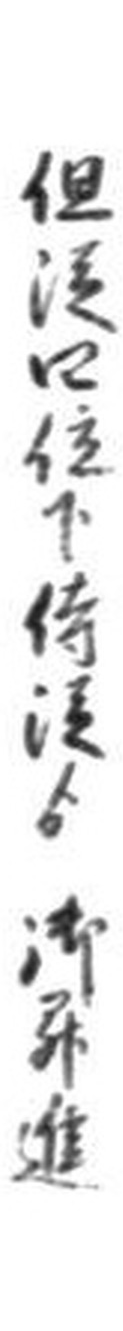但従四位下侍従ゟ御昇進
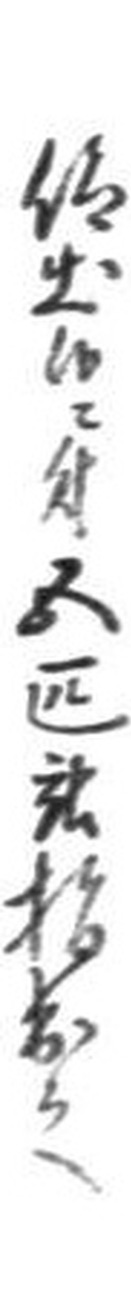仰出候ニ付五匹被指出之
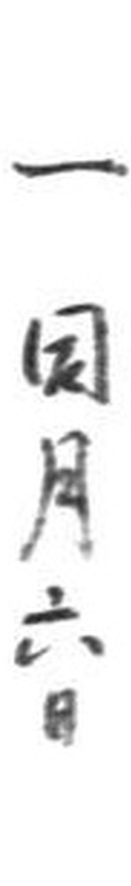一同月六日

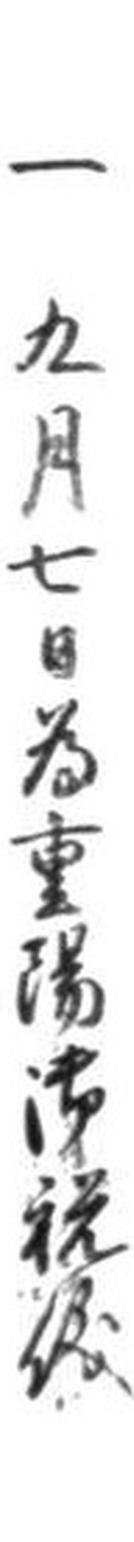一九月七日為重陽御祝儀
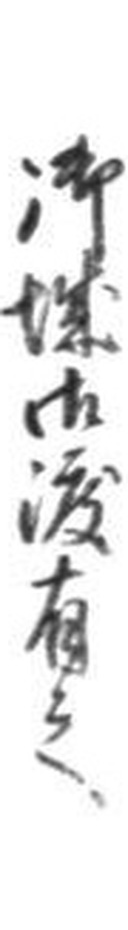御城御渡有之
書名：家譜 三 忠昌公 従慶長八年到寛永六年
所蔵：福井県文書館 Fukui Prefectural Archives
